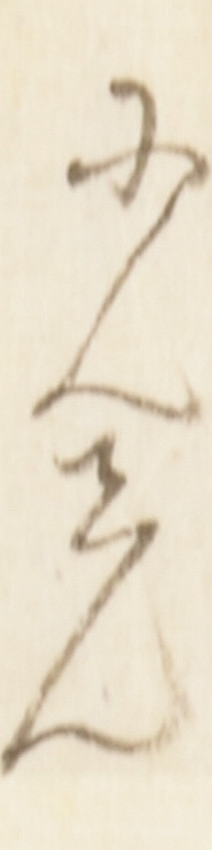にんしん
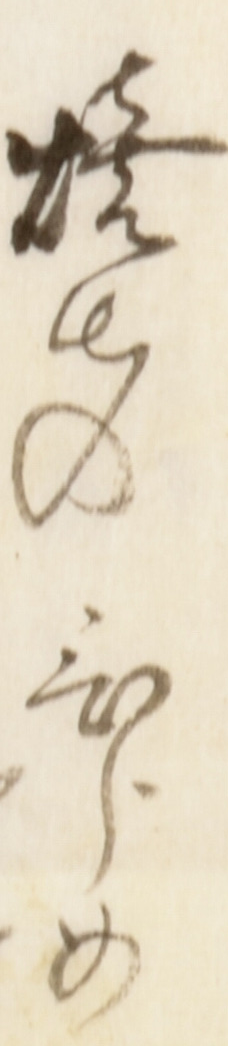焼ものひらめ
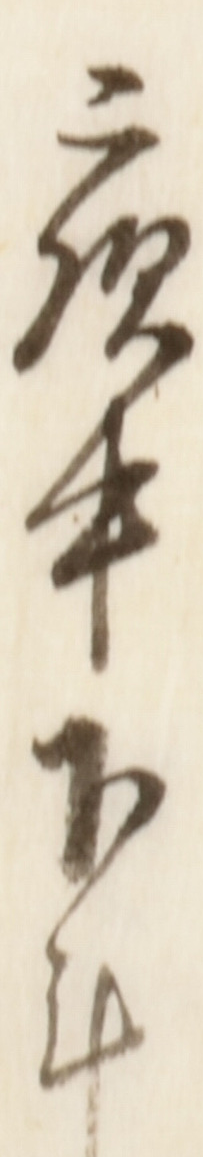夜中下斗

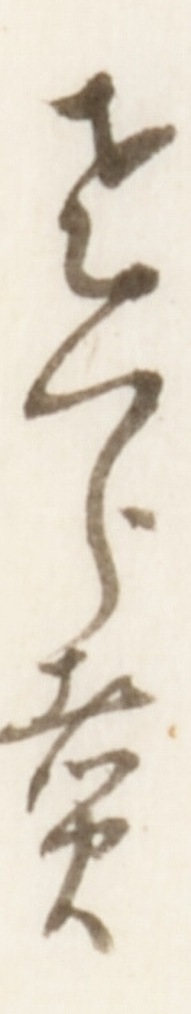さくら煮
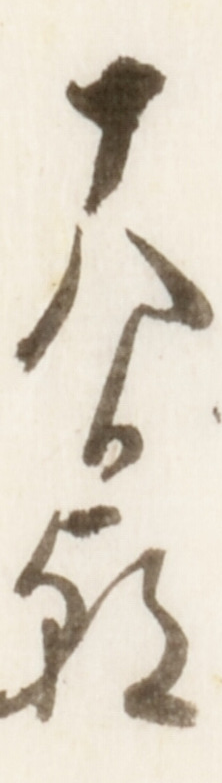十八日朝
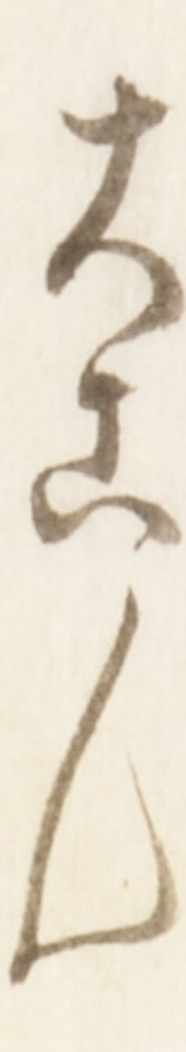大こん
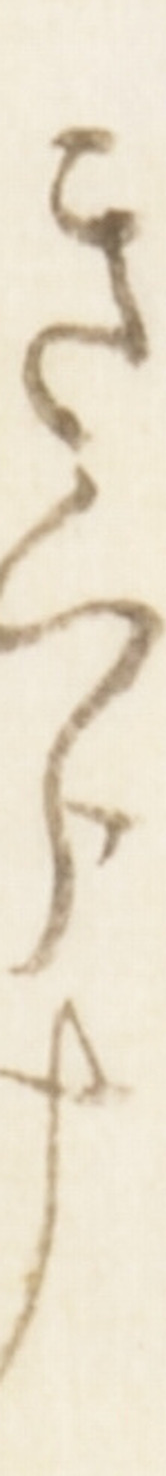きくらけ
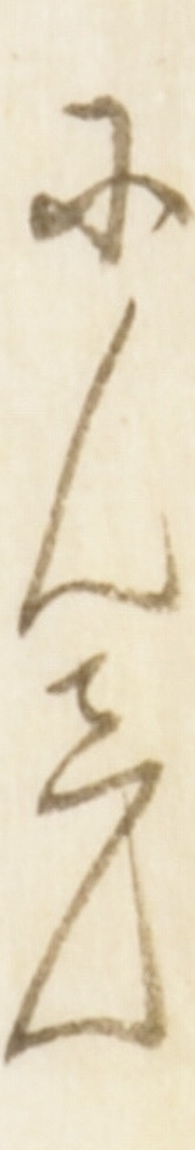にんしん
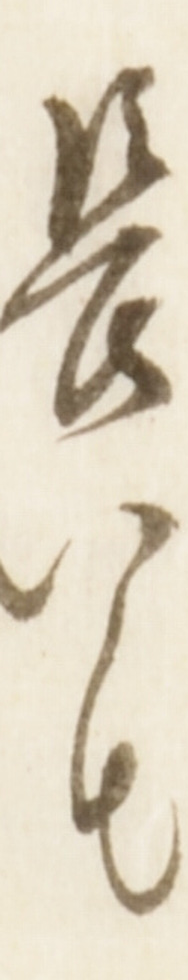長いも
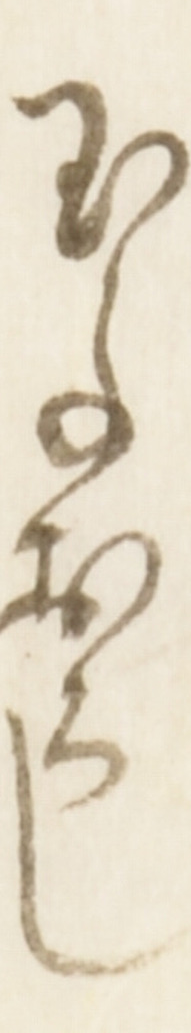玉子おろし
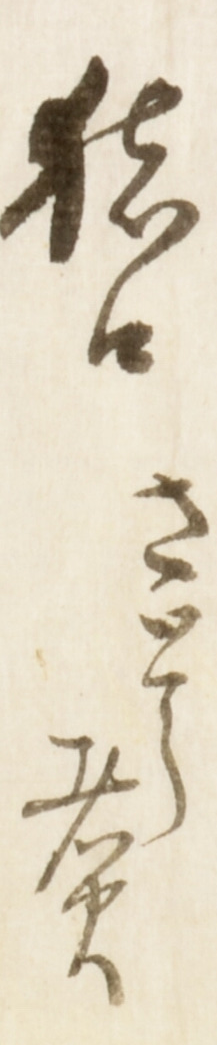猪口さとう
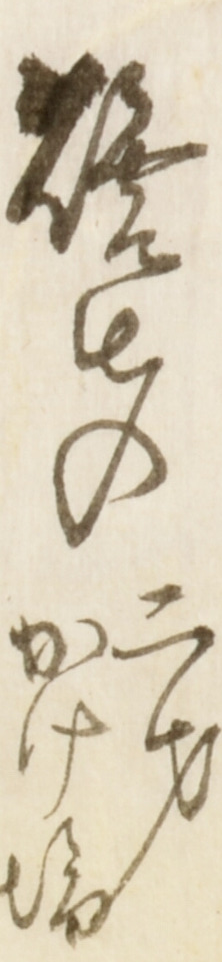焼もの二才
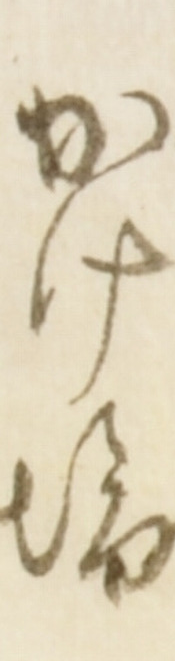かけ場

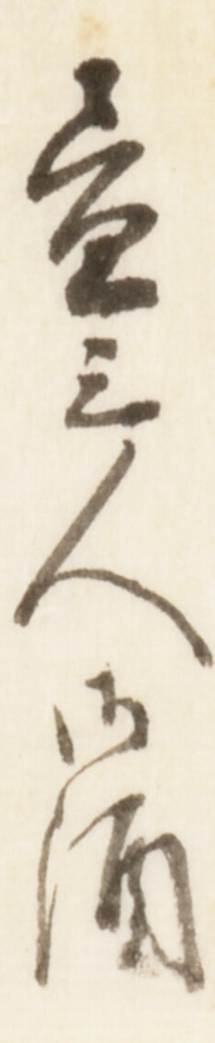昼三人御酒
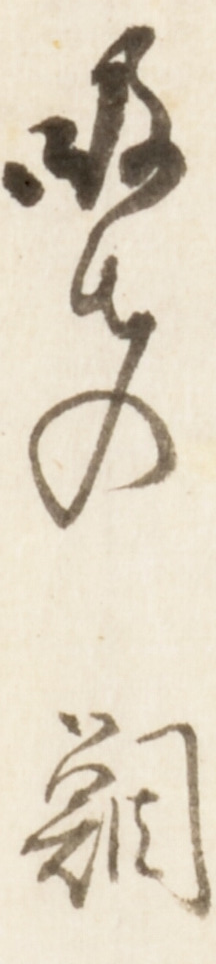吸もの鯛
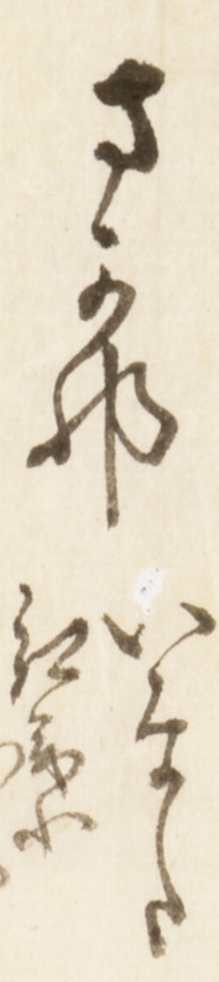さかないなた
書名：（諸事控）
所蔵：伊那市立高遠町図書館・合同会社AMANE
